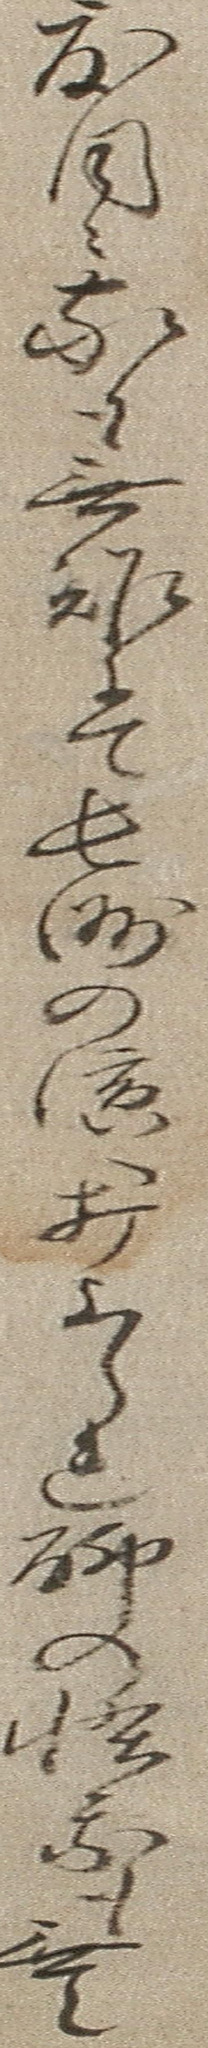度目に家も無難にて長洲の浜へ打上られ聊の怪我も無候
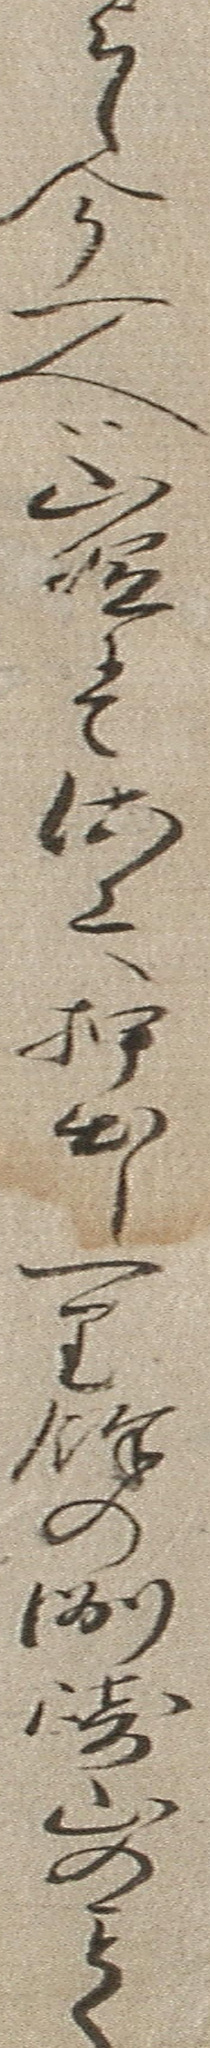よし今一人は山？にて海上へ押出し一里余の洲崎やまのことく
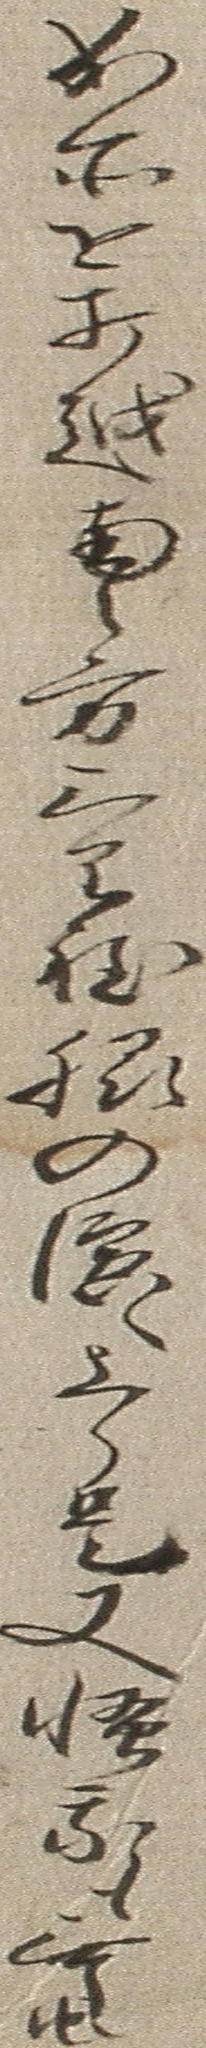成所を打越南之方三里程脇の浜へ上り是又怪我も無候由
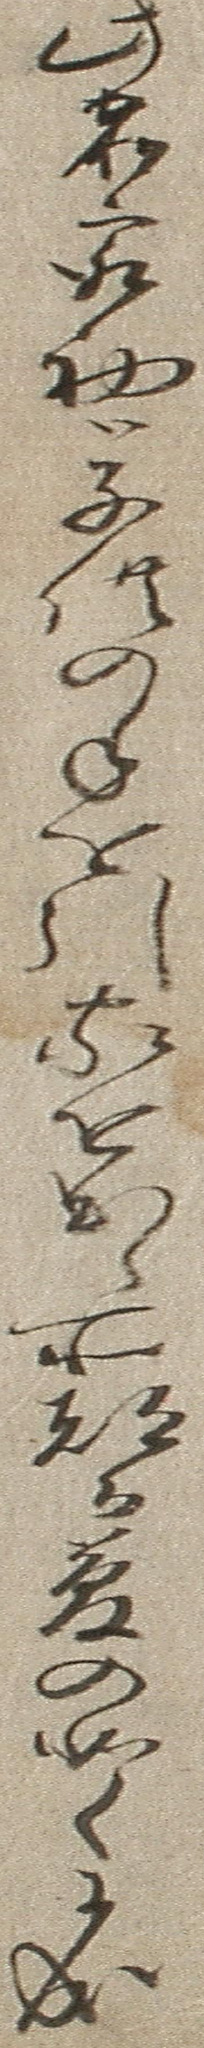此者最初は子供の手を引家を出候所都而夢の如くに成
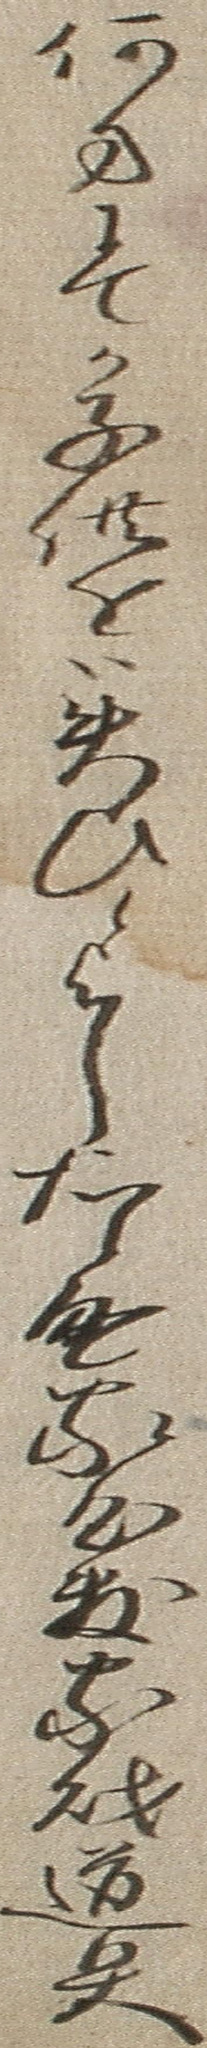何方にてか子供をは失ひ候よし右之通家屋敷家財道具
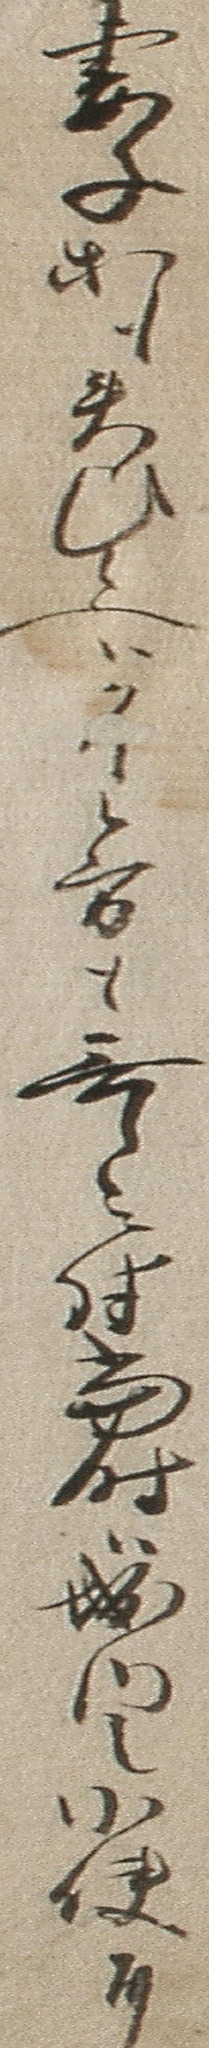妻子等も失ひ候へは？之方も無之に付当時は城内の小使に
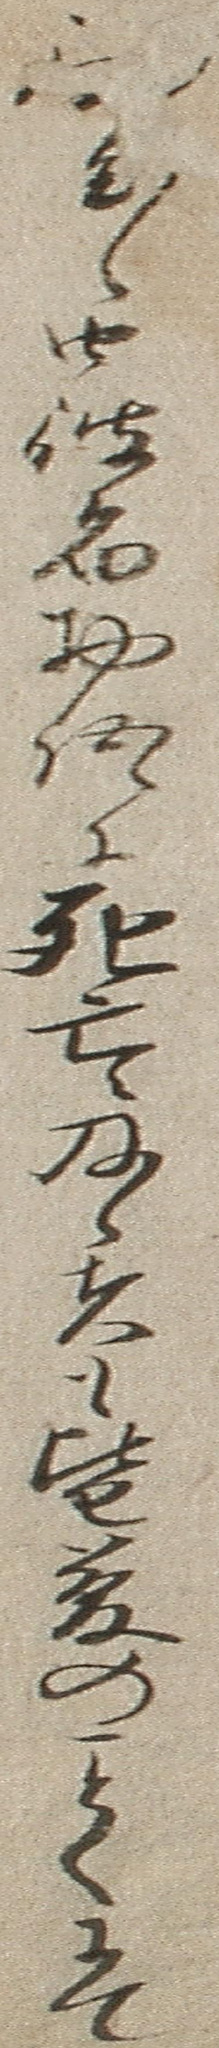？置候由彼者物語に死亡に及候者も皆夢のことくにて
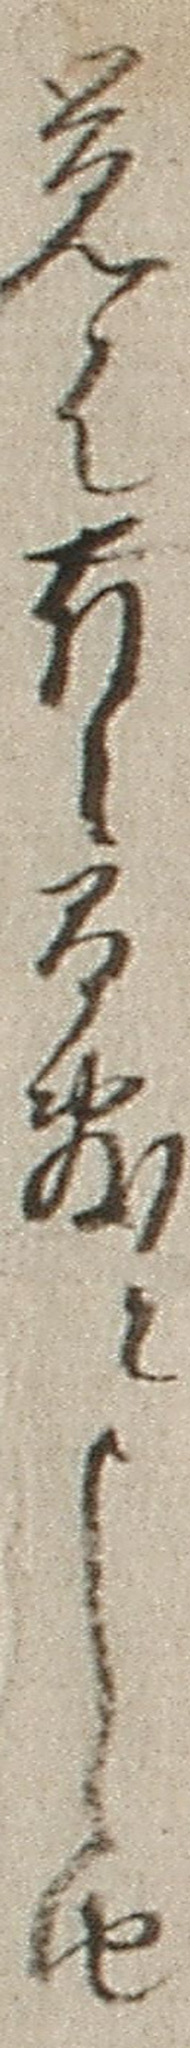覚え有之間敷と申候由

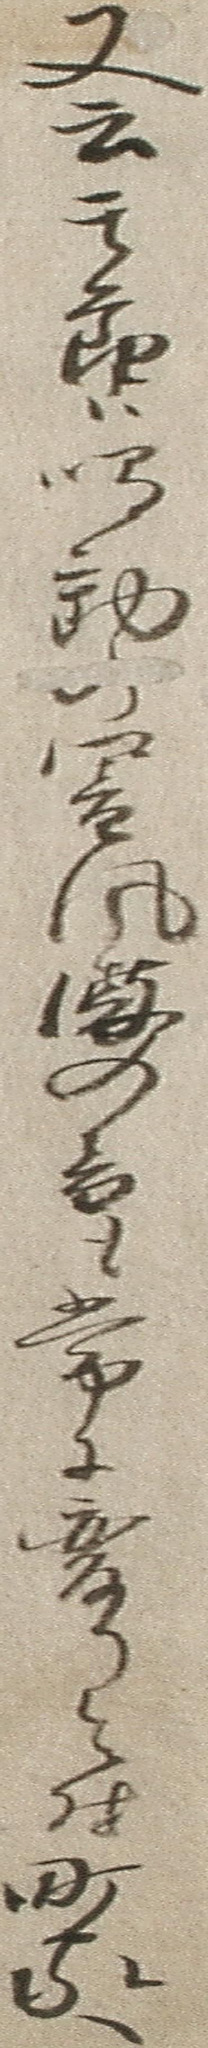又云其節は鳴動の響風波の音も常に変り候に付町家へ
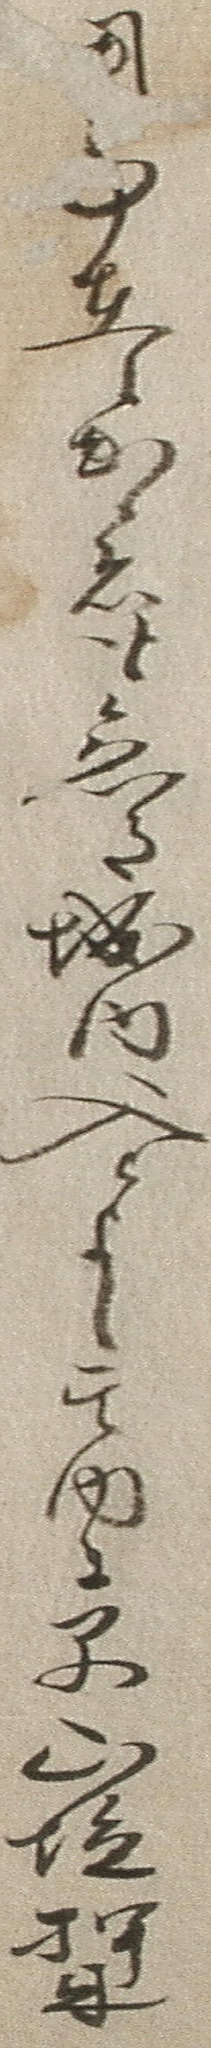用事在之出候者も急き城内へ入候よし其内に早山塩押来
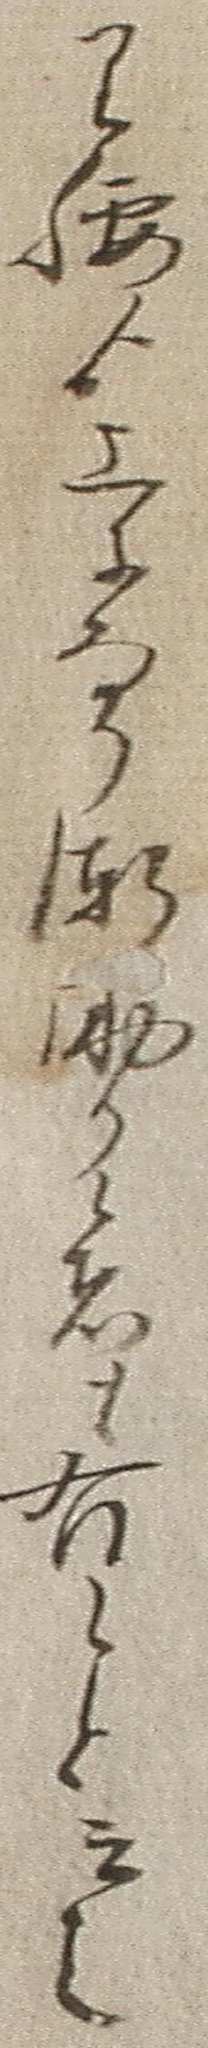り腰ゟ上になり漸助り候者も有之と云申候
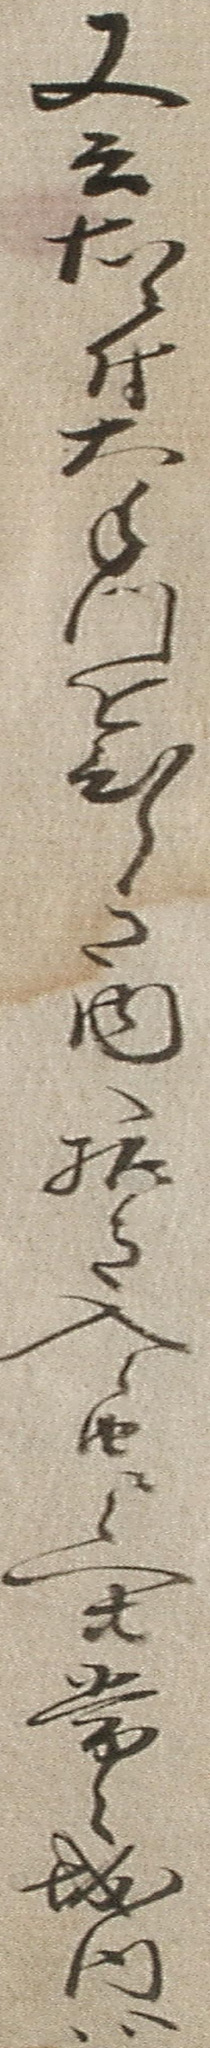又云右に付大手門をひらき内へ招き入候由に候へ共常々城内へは
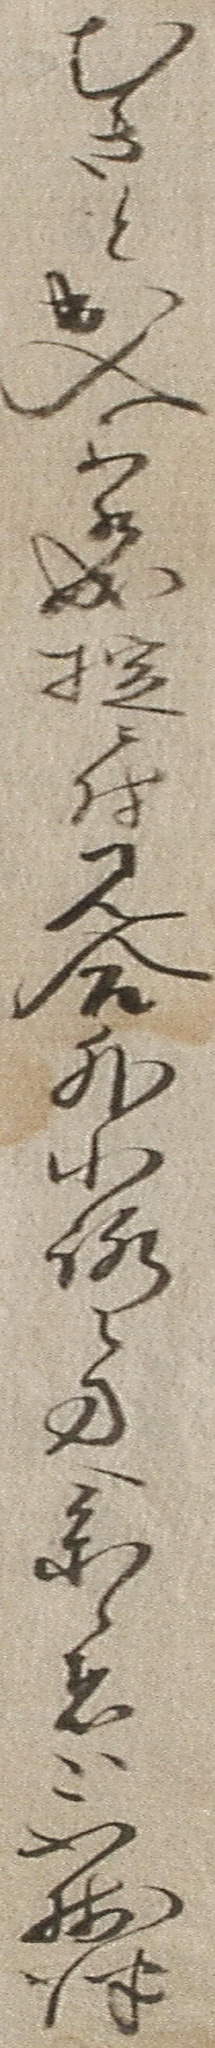むさと出入不相成掟に付見合外小路之方へ参候者は不残津
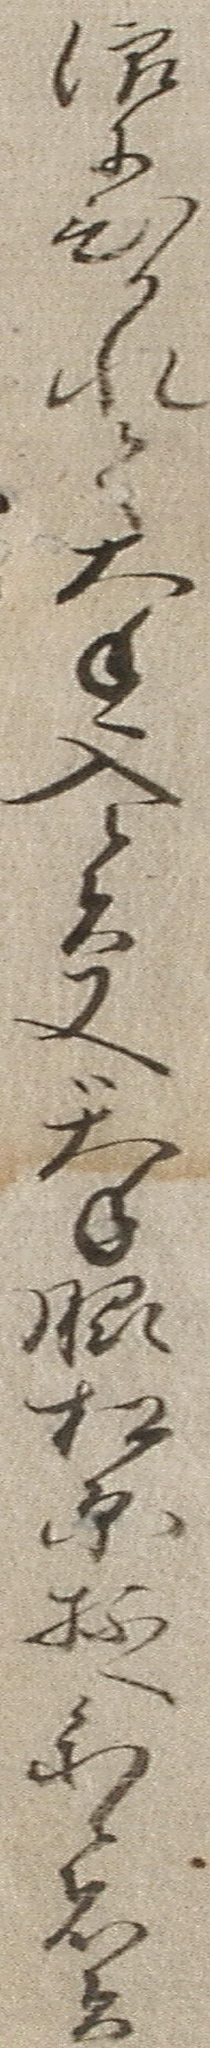浪にひかれて大手へ入候者又は大手脇松原抔へ参候者は
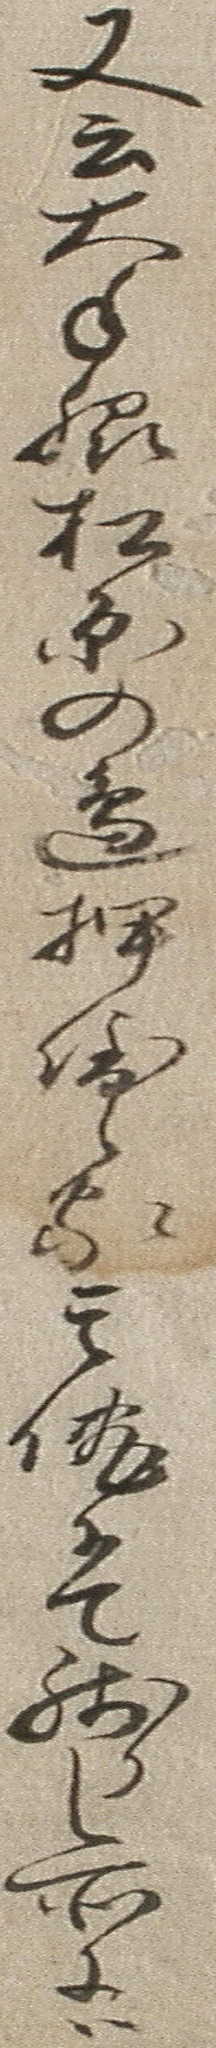又云大手脇松原の辺押倒候家其儘にて残りし所には
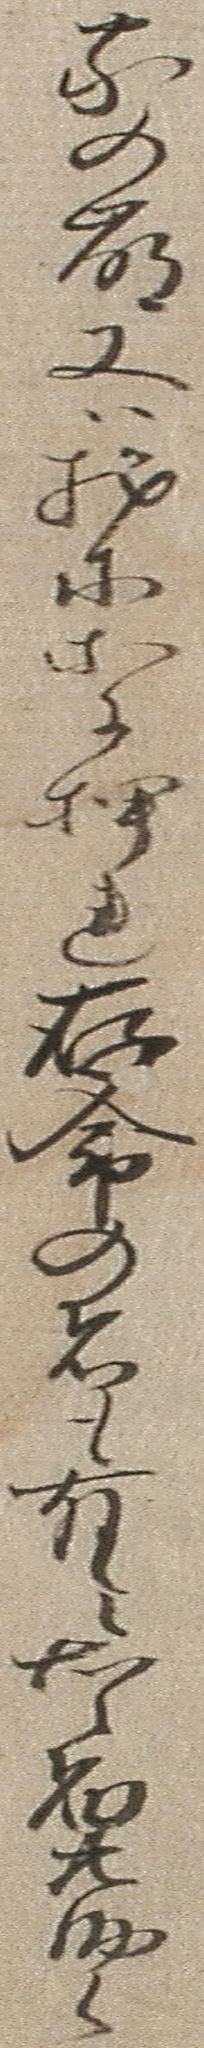家の崩又は材木等に押れ存命の者も有之候右之者共助候
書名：太平秘録抜書　浅間山燒及普賢山崩
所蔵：東京大学地震研究所図書室 Earthquake Research Institute Library, The University of Tokyo, JAPAN
